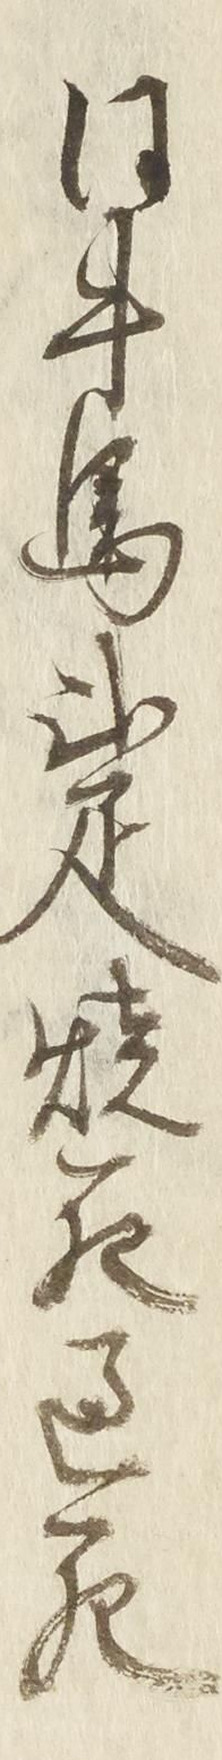同牛馬弐疋焼死過死
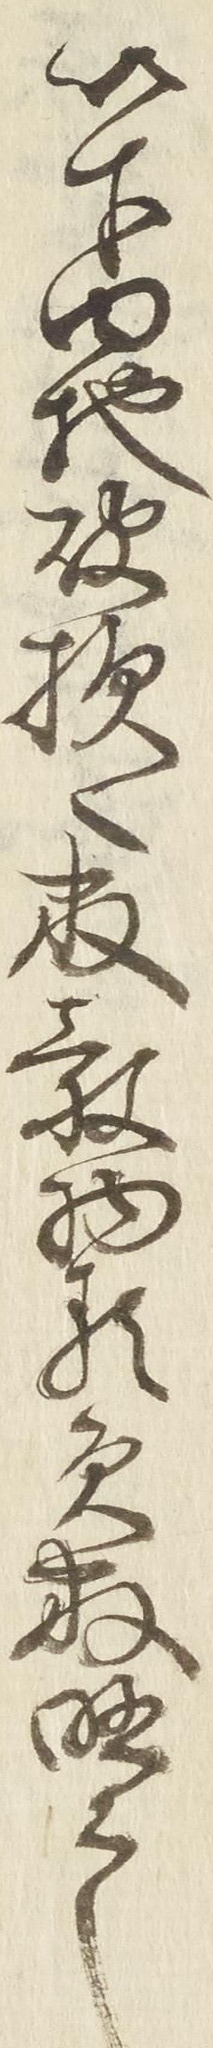以下田地破損之数穀物類員数略之
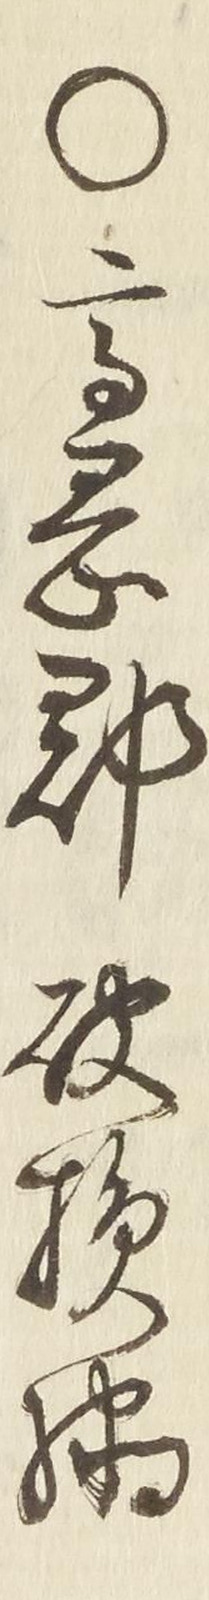◯高岡郡破損縮
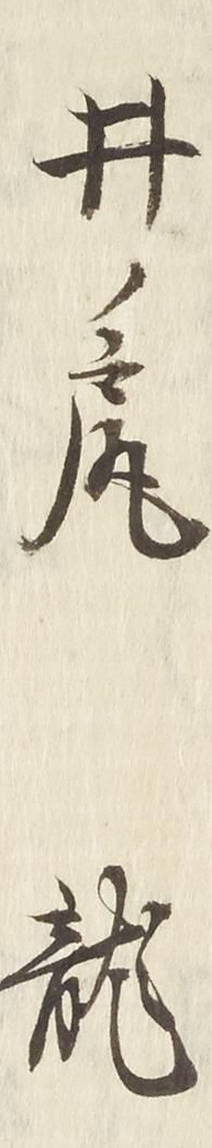井ノ虎龍
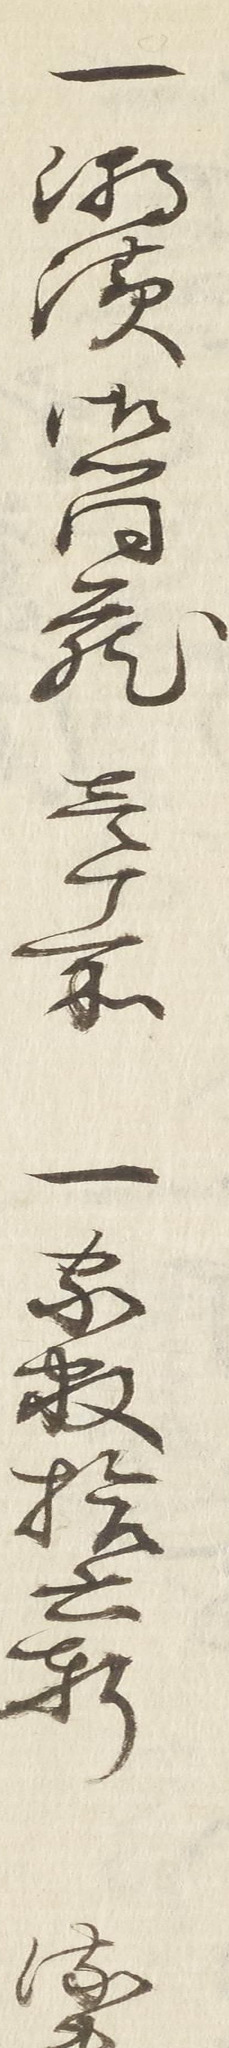一潮浜御筒蔵壱ヶ所一家数拾六軒流失
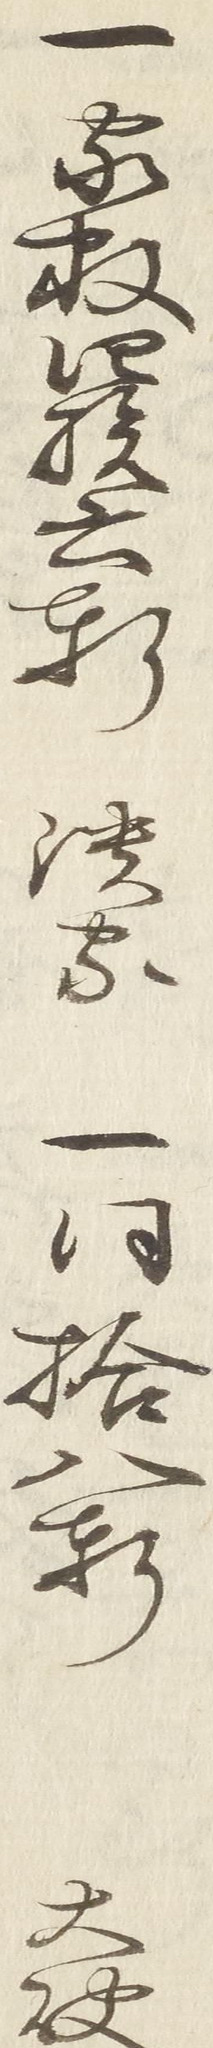一家数四拾六軒潰家一同拾八軒大破
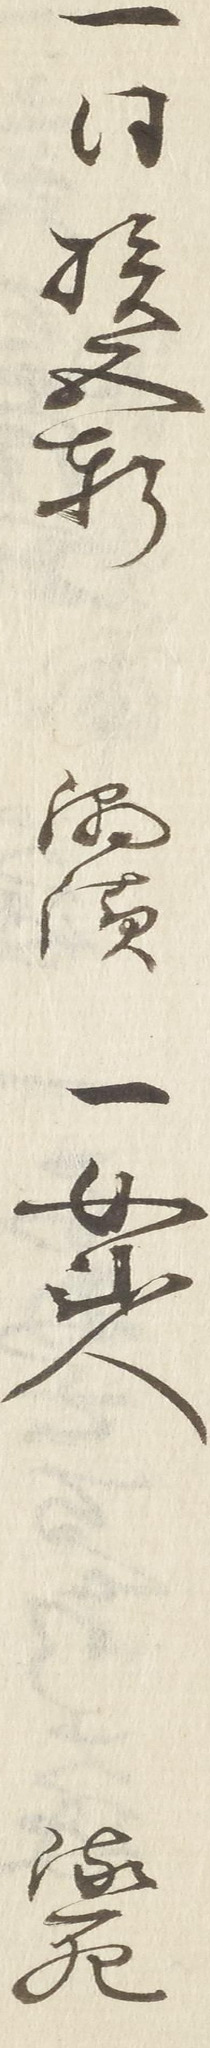一同拾五軒潮漬一女弐人流死
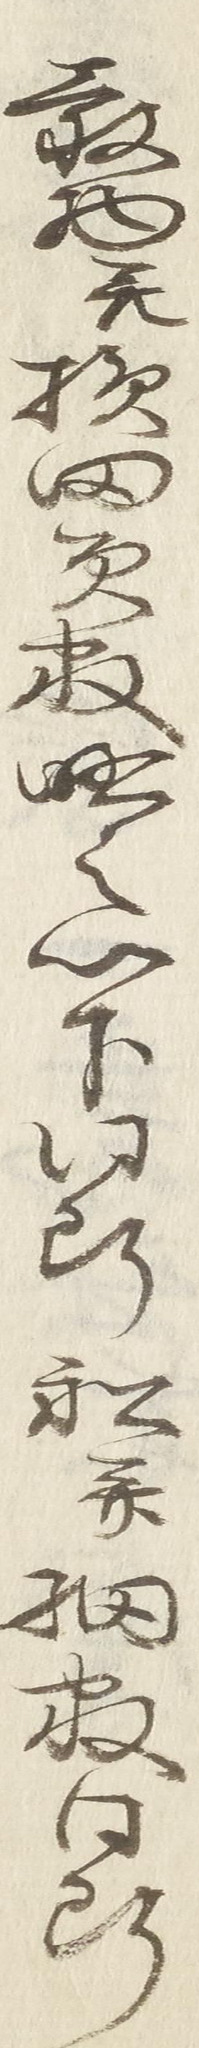穀物并損田員数略之以下同断船并網数同断
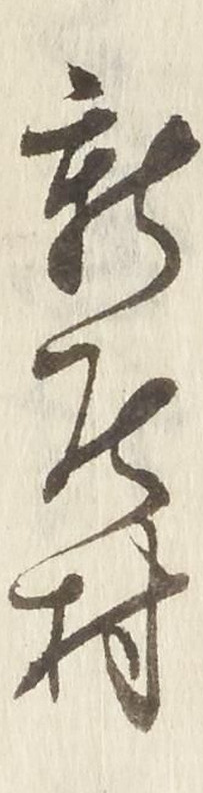新居村
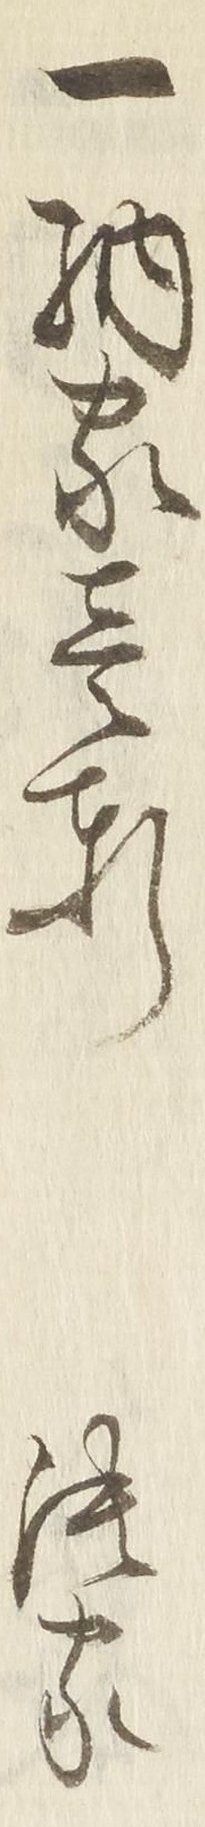一納家壱軒潰家
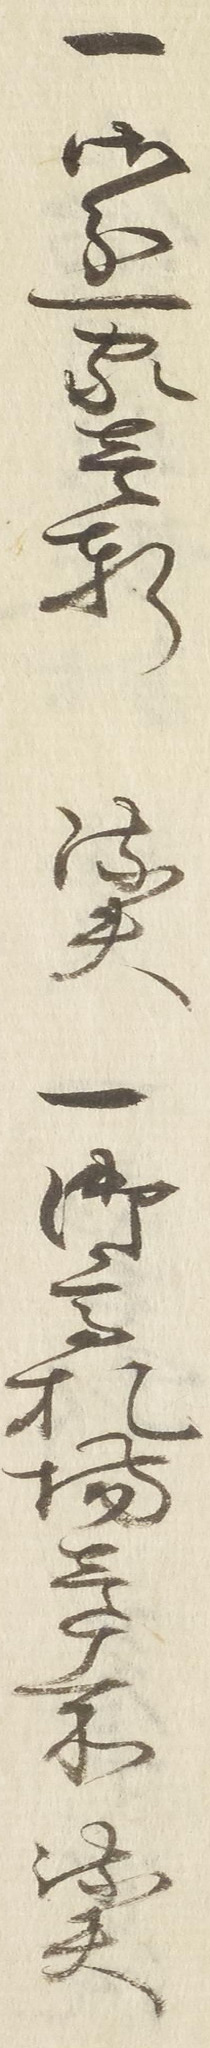一御分一家壱軒流失一御高札場壱ヶ所流失

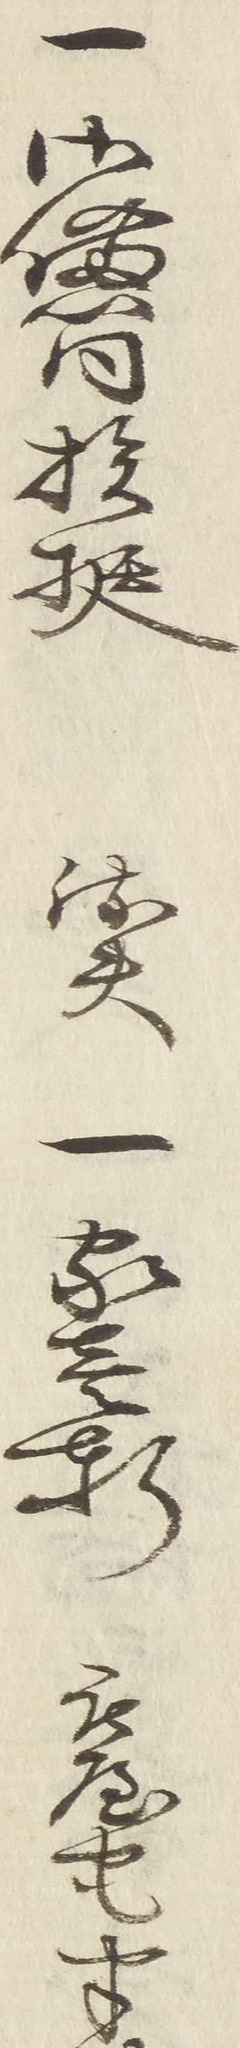一御備筒拾挺流失一家壱軒庄屋宅半潰
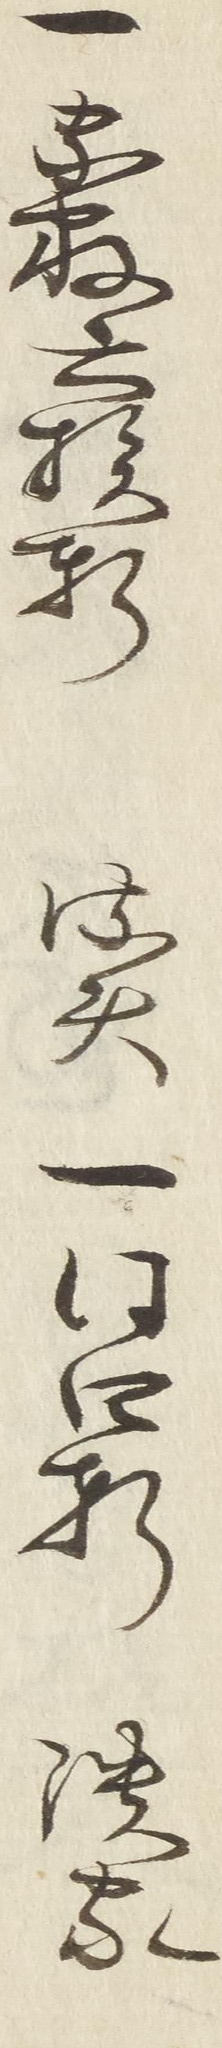一家数六拾軒流失一同四軒潰家
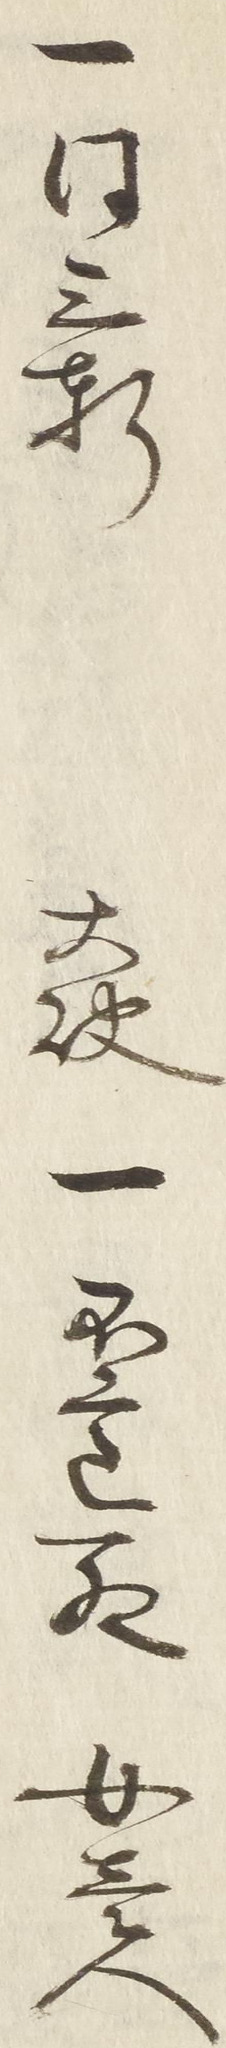一同三軒大破一不意死女壱人
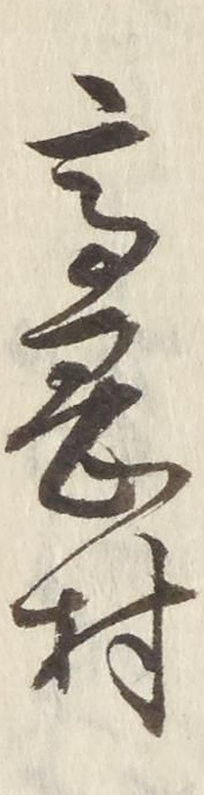高岡村
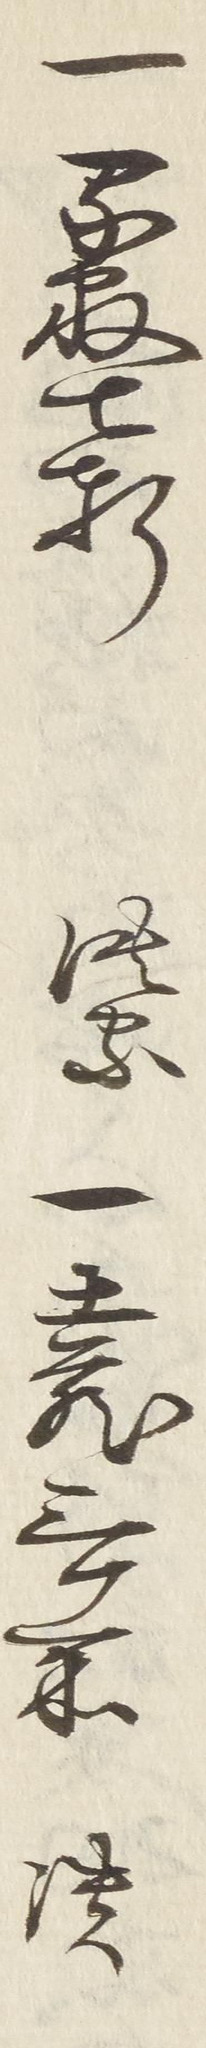一家数七軒潰家一土蔵三ヶ所潰
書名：地震記　下
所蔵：東京大学地震研究所図書室 Earthquake Research Institute Library, The University of Tokyo, JAPAN
